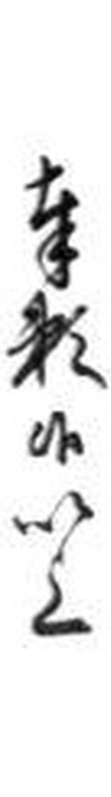奉願候以上
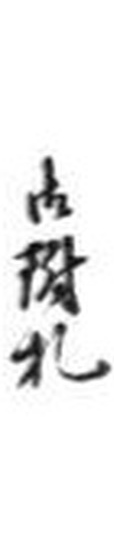御付札
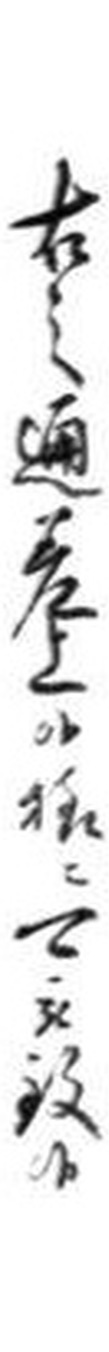右之通差上候様ニ可被致候
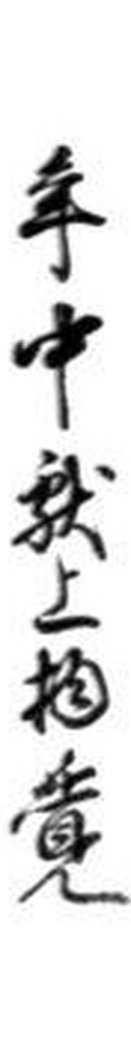年中献上物覚
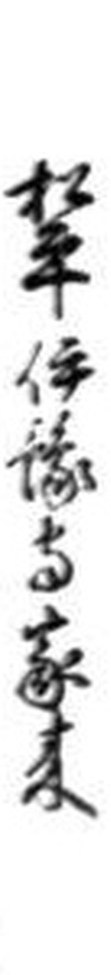松平伊予守家来
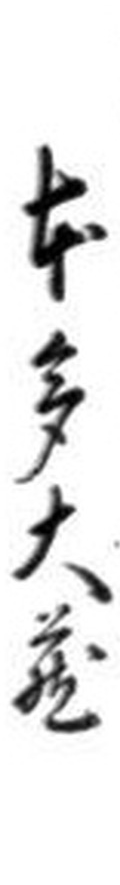本多大蔵
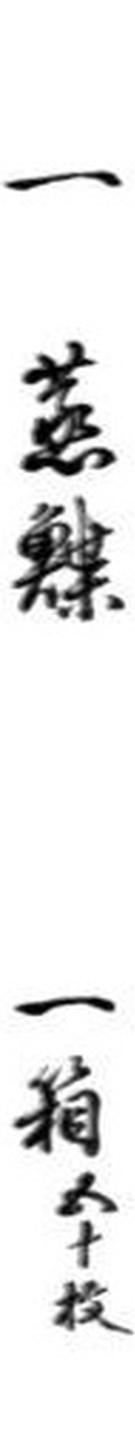一蒸鰈一箱五十枚
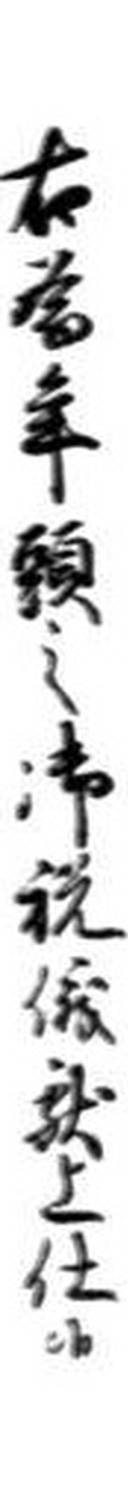右為年頭之御祝儀献上仕候
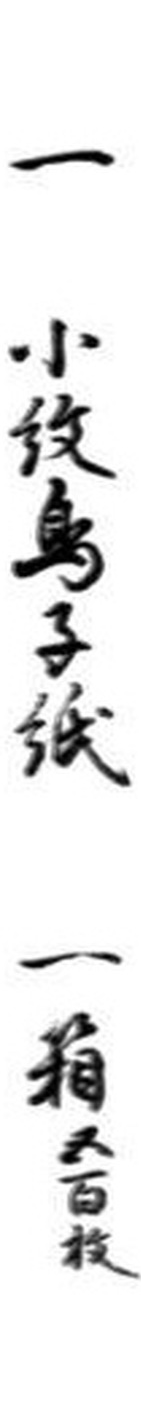一小紋鳥子紙一箱五百枚
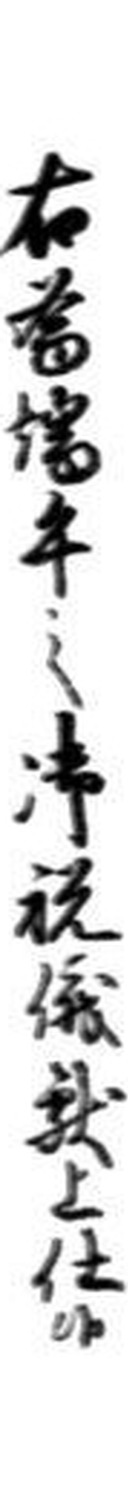右為端午之御祝儀献上仕候
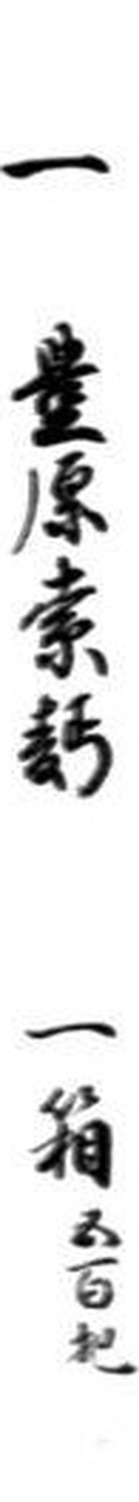一豊原素麪一箱五百把
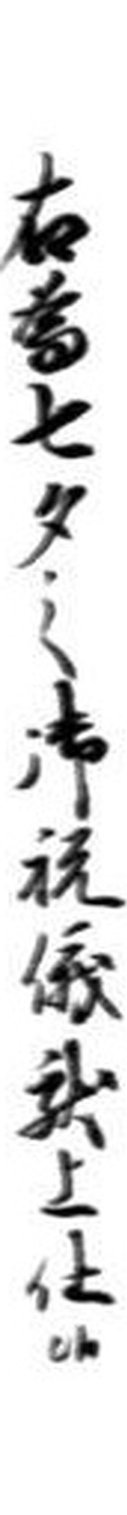右為七夕之御祝儀献上仕候
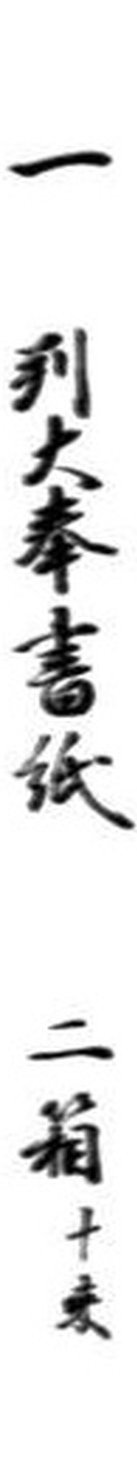一判大奉書紙二箱十束
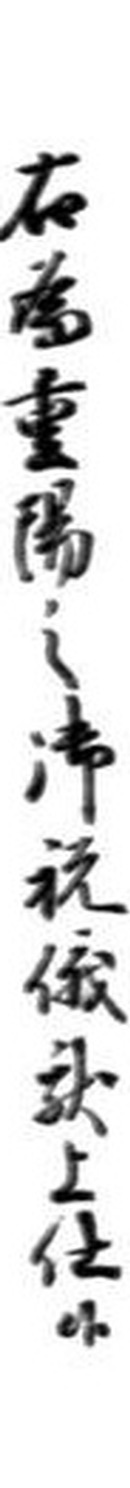右為重陽之御祝儀献上仕候

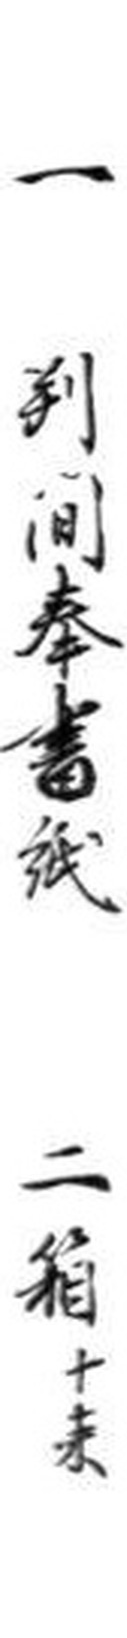一判間奉書紙二箱十束
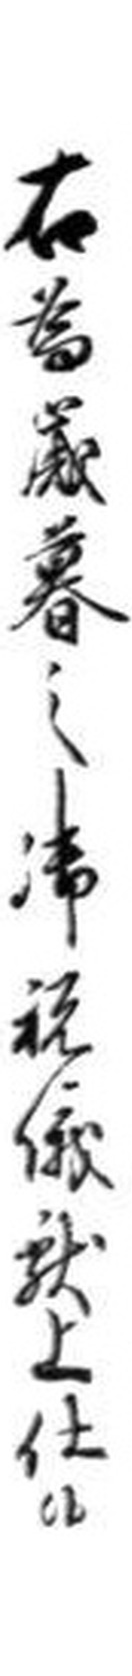右為歳暮之御祝儀献上仕候
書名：家譜 三十二 吉邦公 従享保二年到享保三年
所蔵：福井県文書館 Fukui Prefectural Archives
